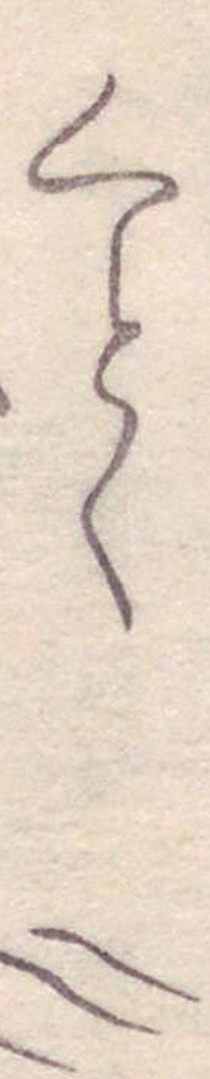くとく
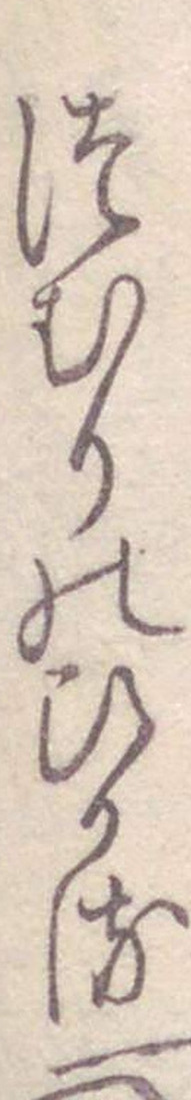つむりのひかる
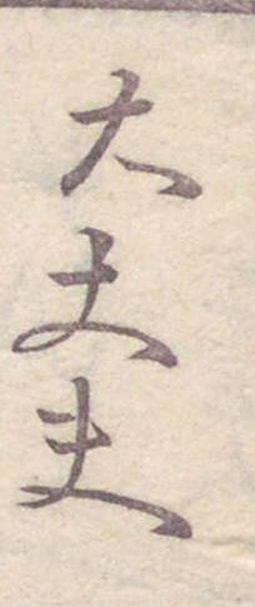大丈夫
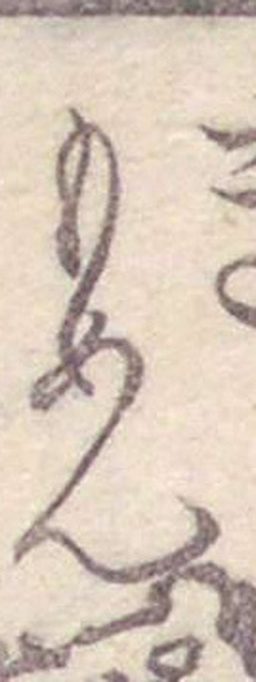もめん
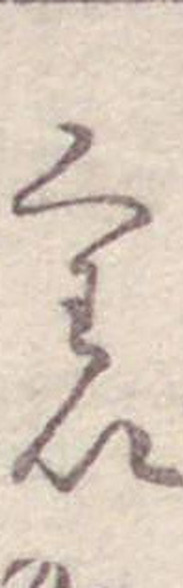くわい
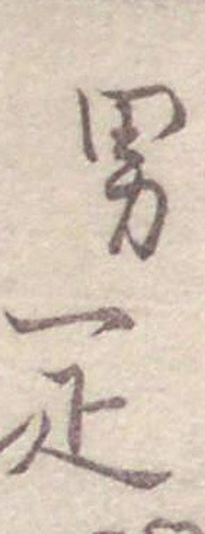男一疋

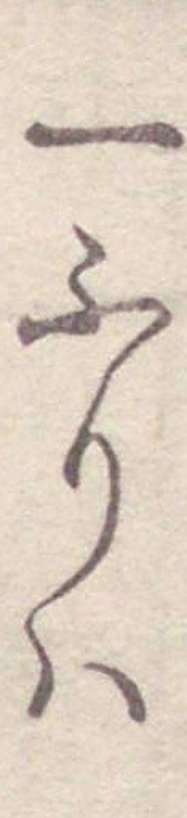一ふりは
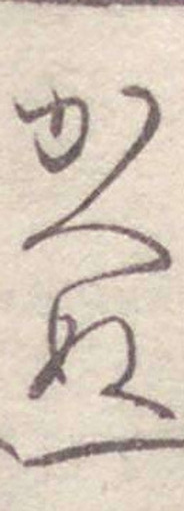かへぬ
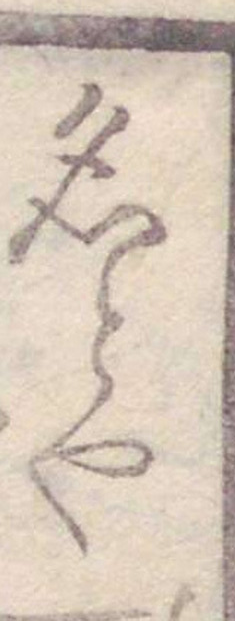名とや

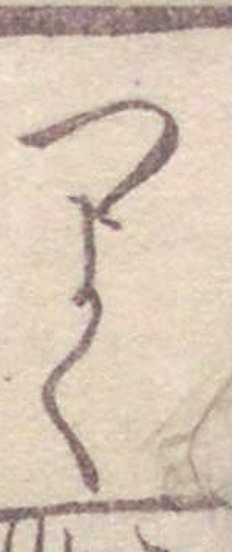つよく
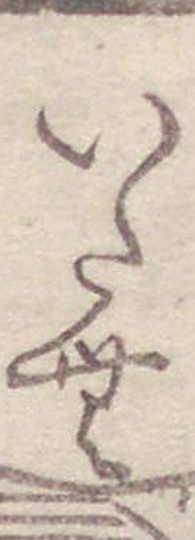いたむ
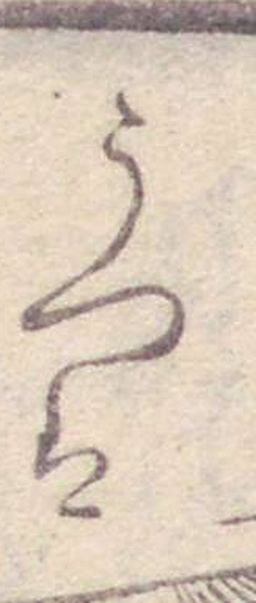うつは
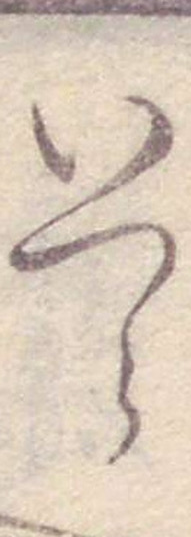いつら
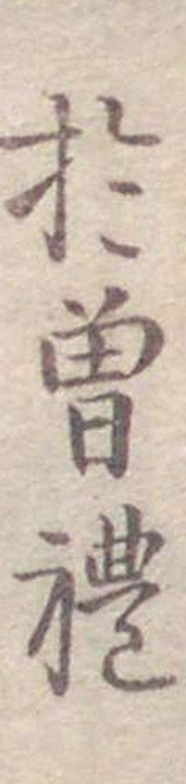於曽礼

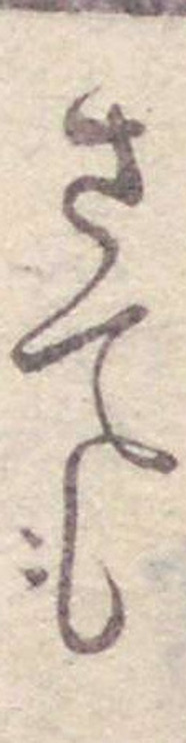さても

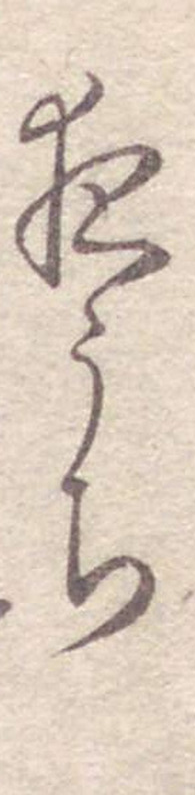夜うち
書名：繪本八十宇治川
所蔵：九州大学中央図書館 国文学研究資料館
